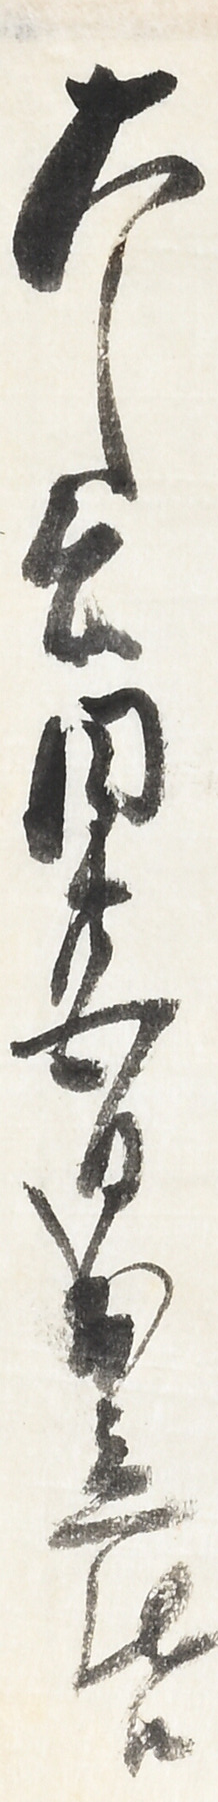右之者同廿五日出立仕候
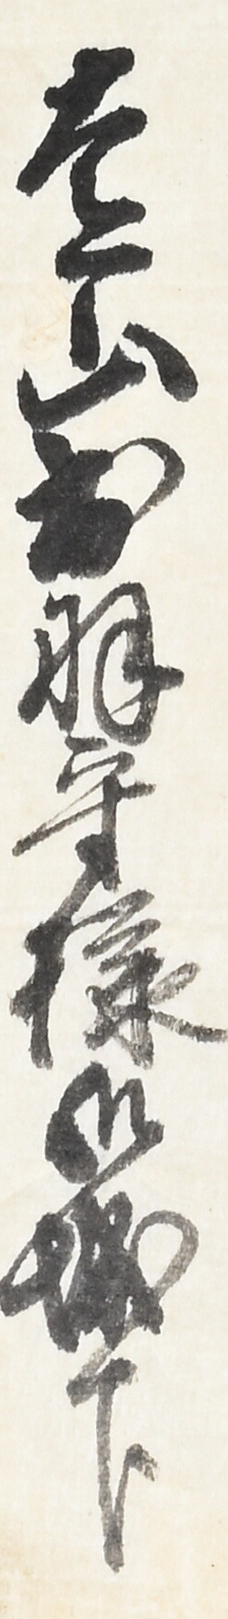遠山出羽守様御城下
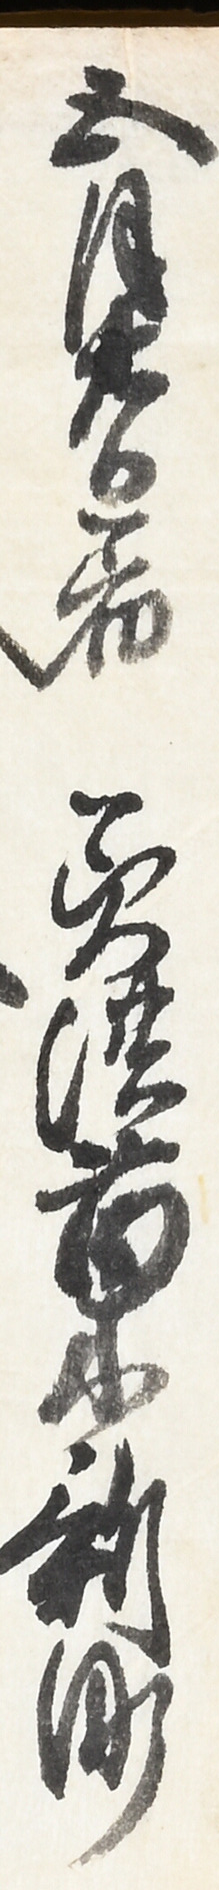五月廿日着美濃苗木新町
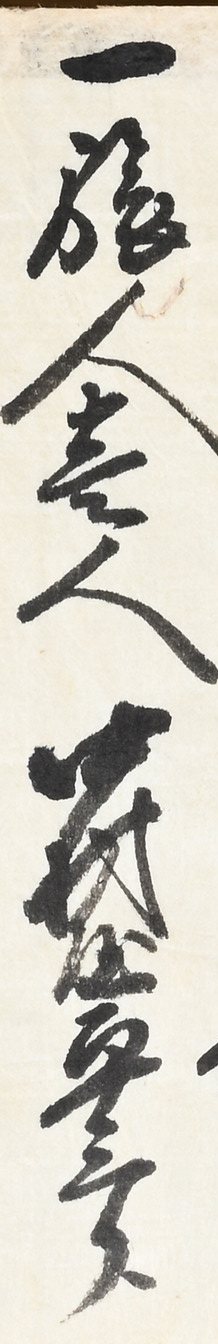一旅人壱人中村屋平三郎
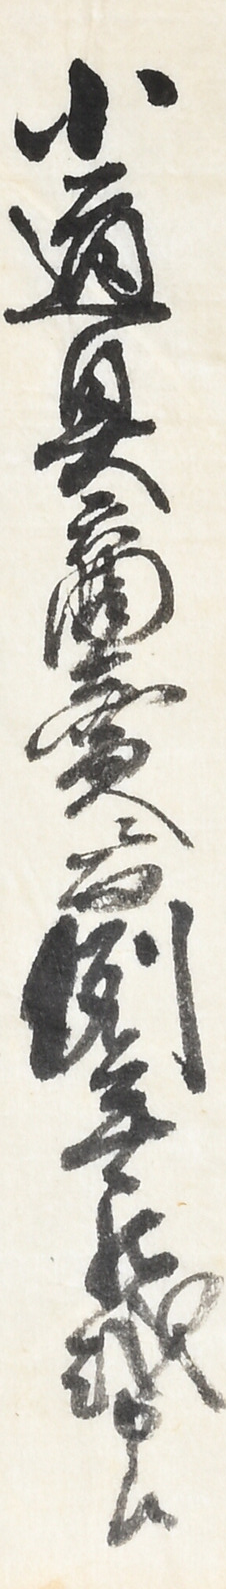小道具商売ニ而例年罷越申候

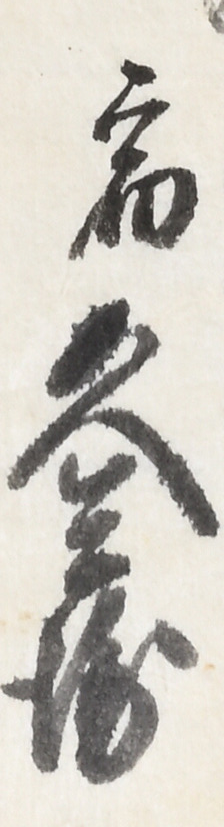宿久兵衛
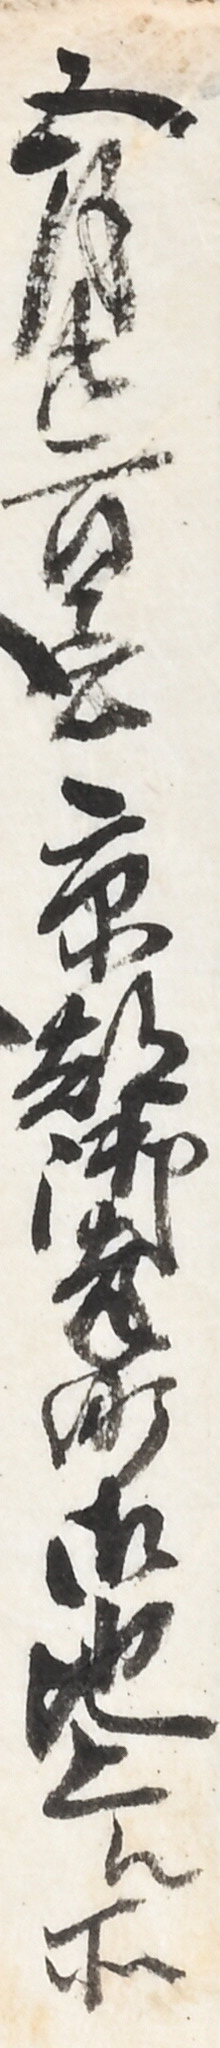五月廿ニ日着京都御幸町御池上ル所
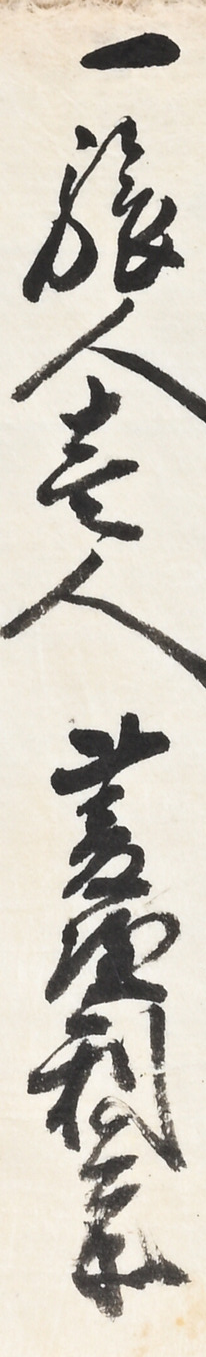一旅人壱人菱屋利兵衛
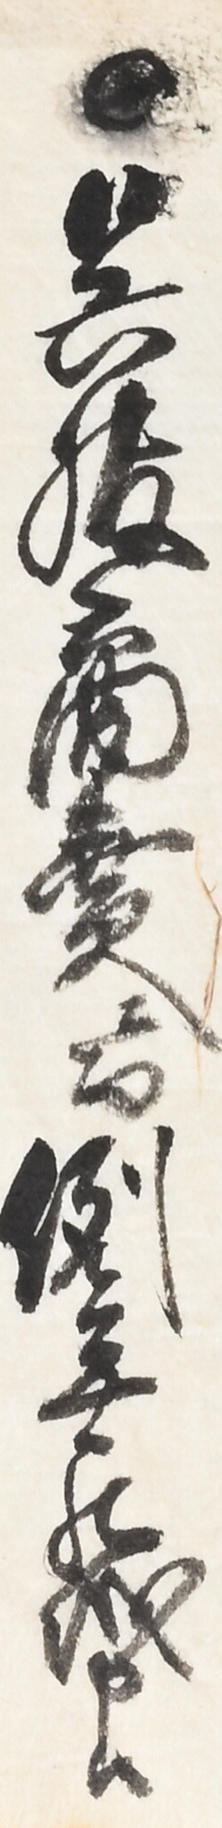呉服商売ニ而例年罷越申候
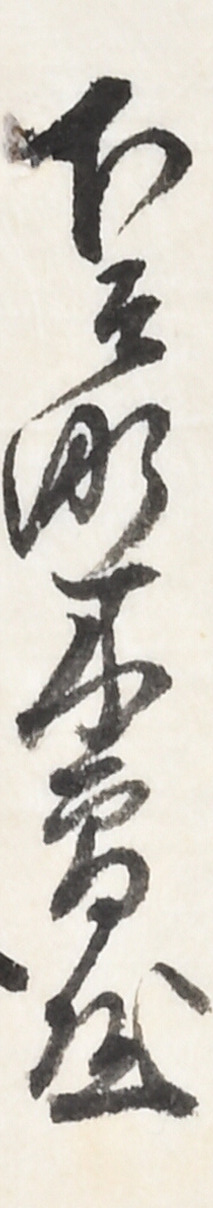下モ町木曽屋
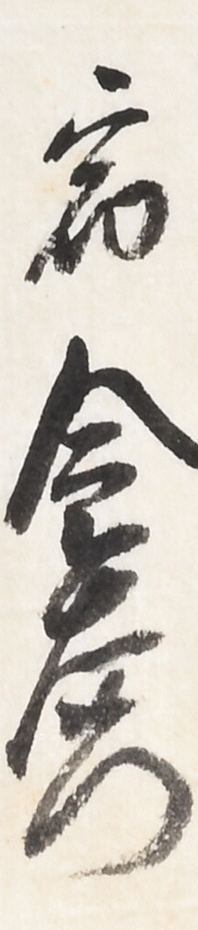宿金右衛門
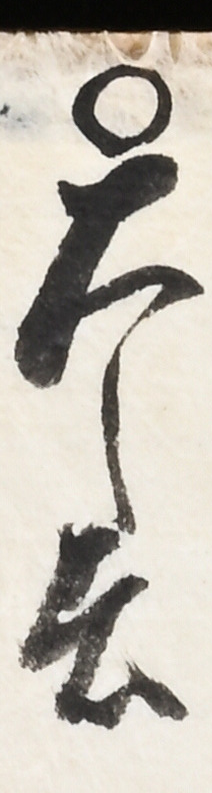〇右之者
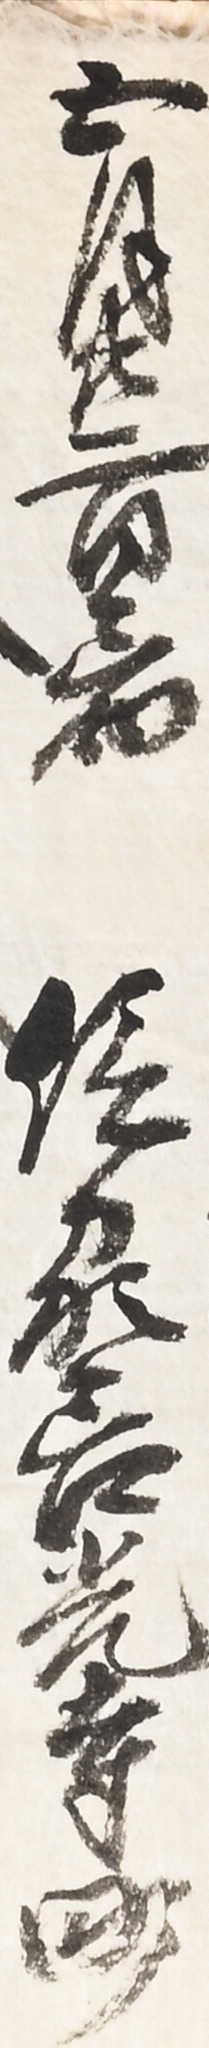五月廿ニ日着信州善光寺町
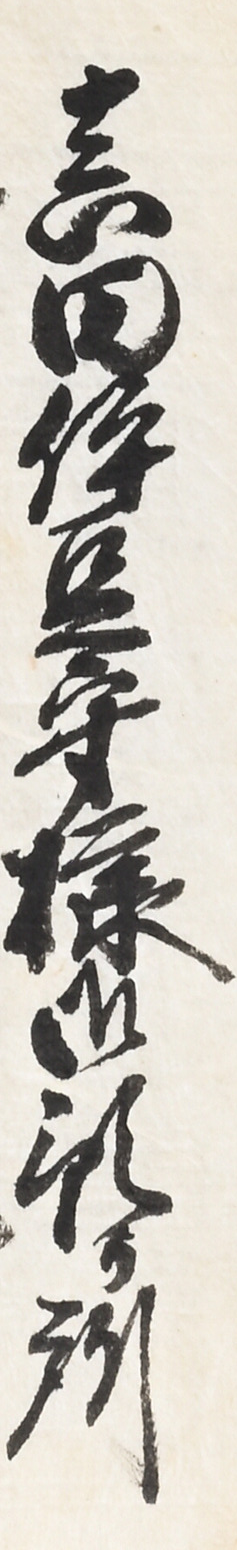真田伊豆守様御預リ所
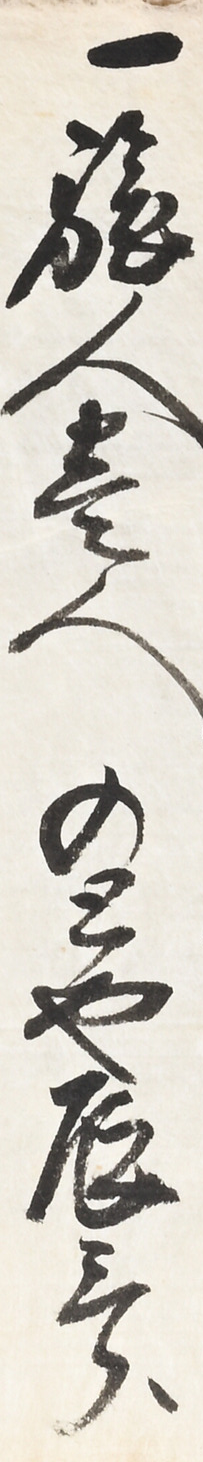一旅人壱人のとや辰三郎
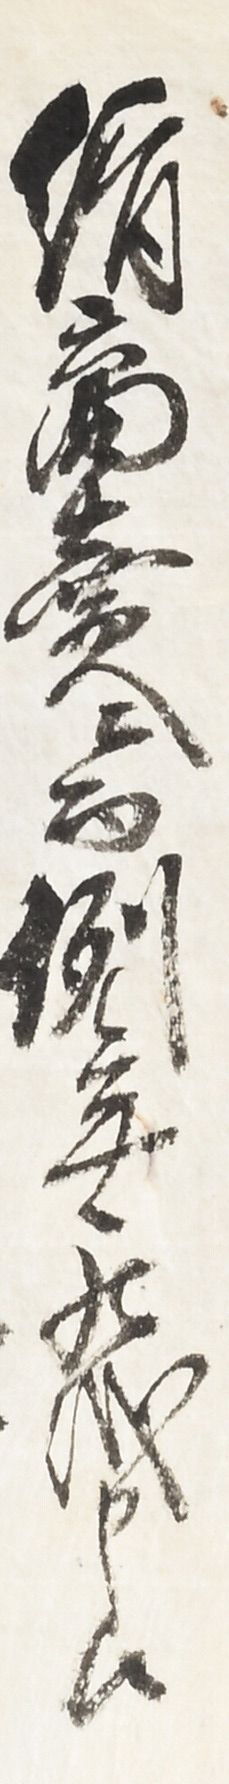絹商売ニ而例年罷越申候
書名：旅人泊控帳
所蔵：伊那市立高遠町図書館・合同会社AMANE
